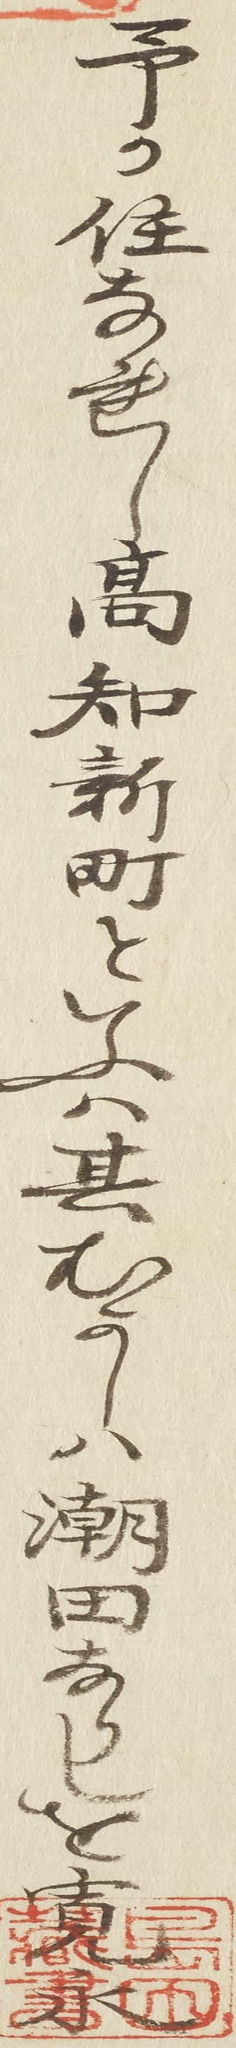予か住なれし高知新町といふは其むかしは潮田なりしを寛永
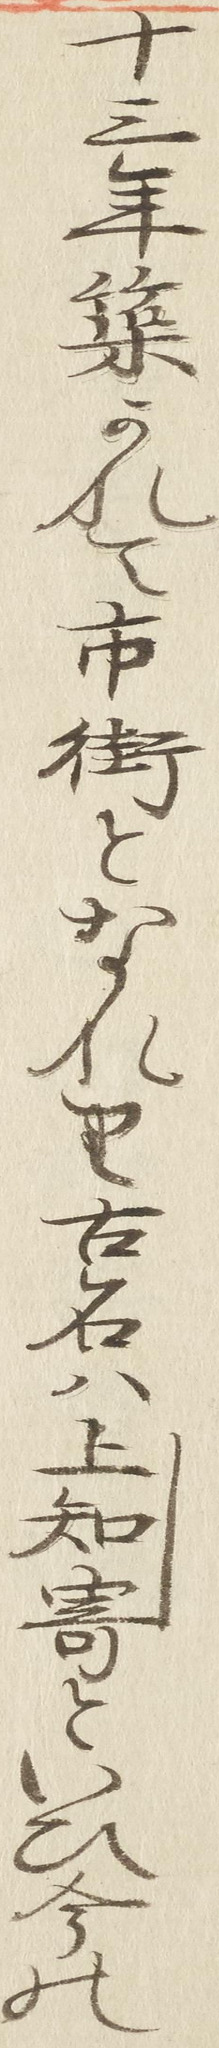十三年築かれて市街となれり古名は上知寄といひ今の
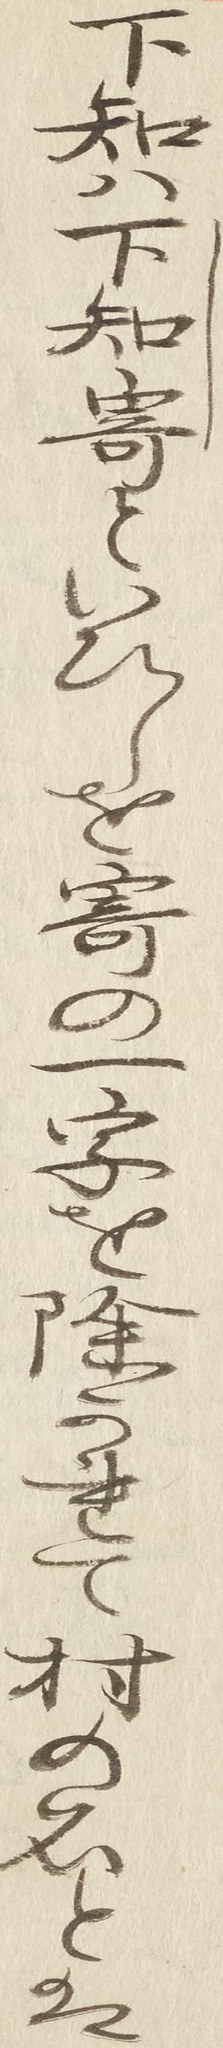下知は下知寄といひしを寄の一字を除かれて村の名とは
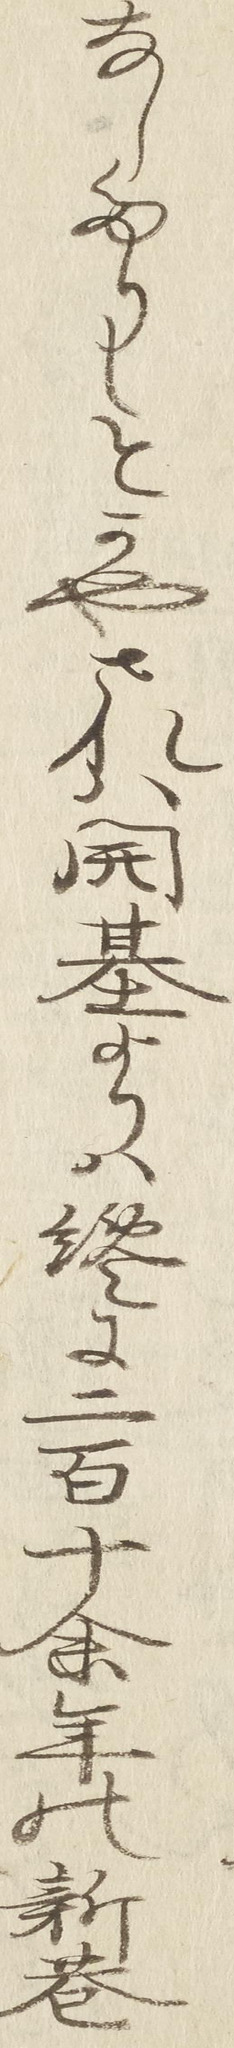なしたりしとかやされは開基よりは纔に二百十余年の新巷
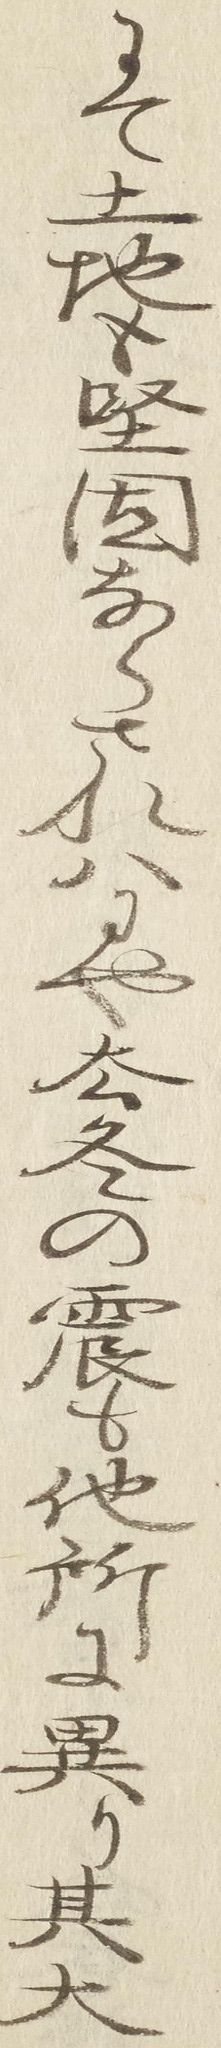にて土地も堅固ならされはにや去冬の震も他所に異り其大
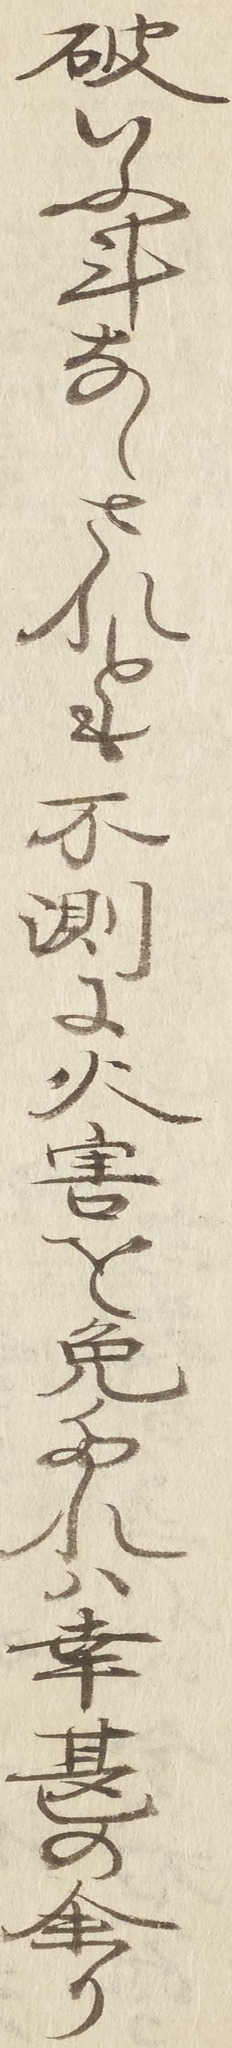破いふ斗なしされとも不測に火害を免たれは幸甚の余り
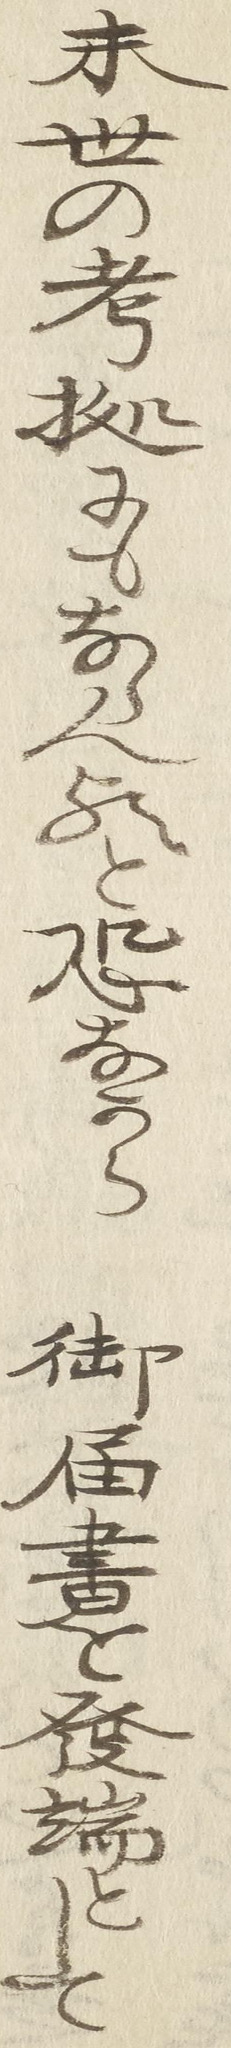末世の考拠にもならん歟と恐なから御届書を発端として
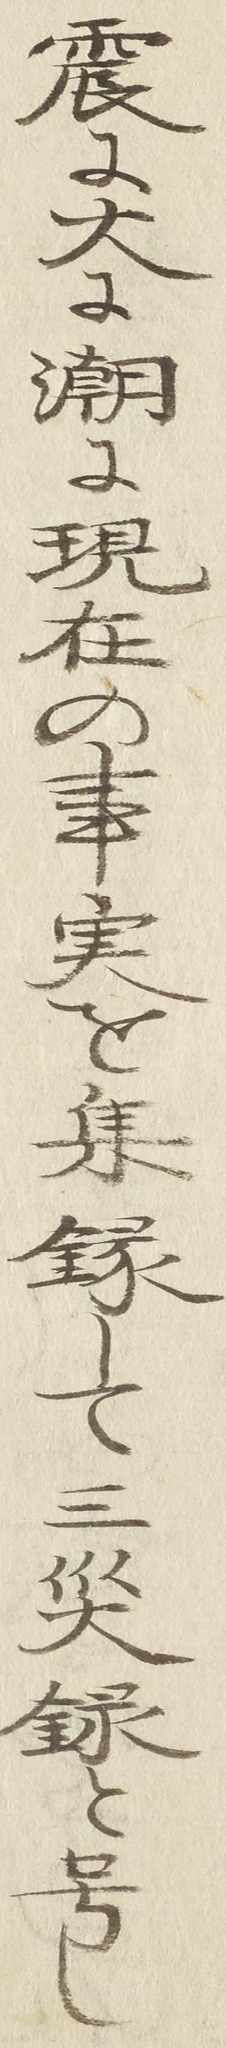震に火に潮に現在の事実を集録して三災録と号し
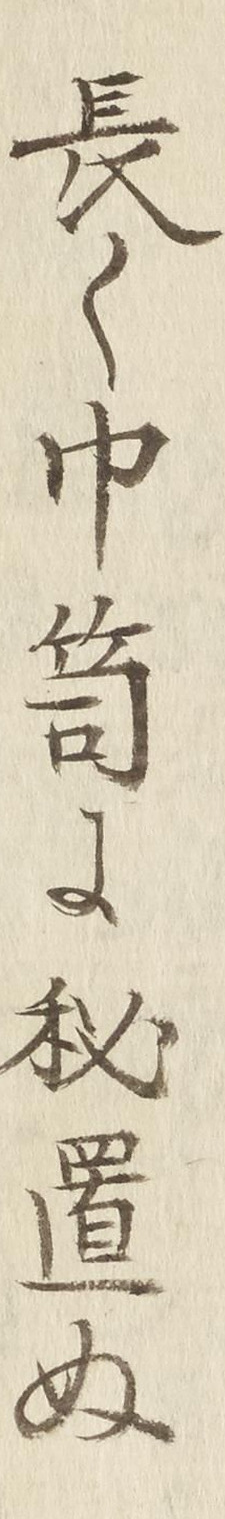長く巾笥に秘置ぬ

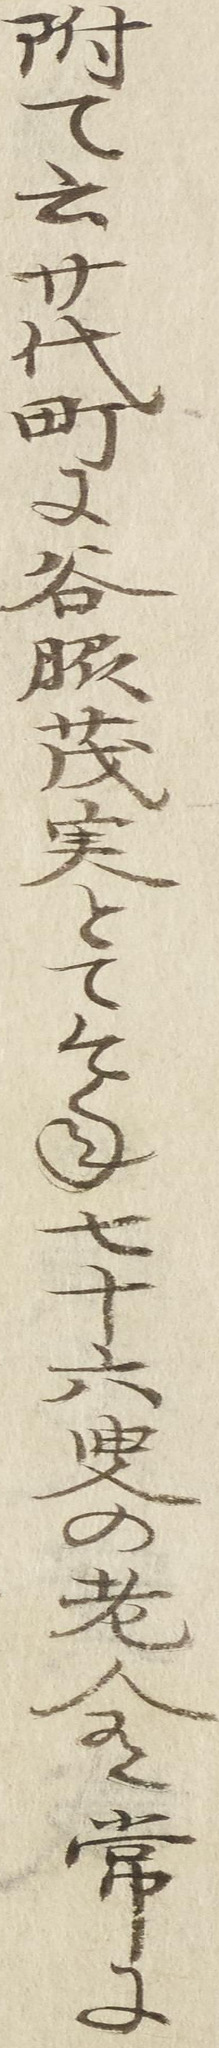付て云廿代町に谷脇茂実とて今年七十六叟の老人有常に
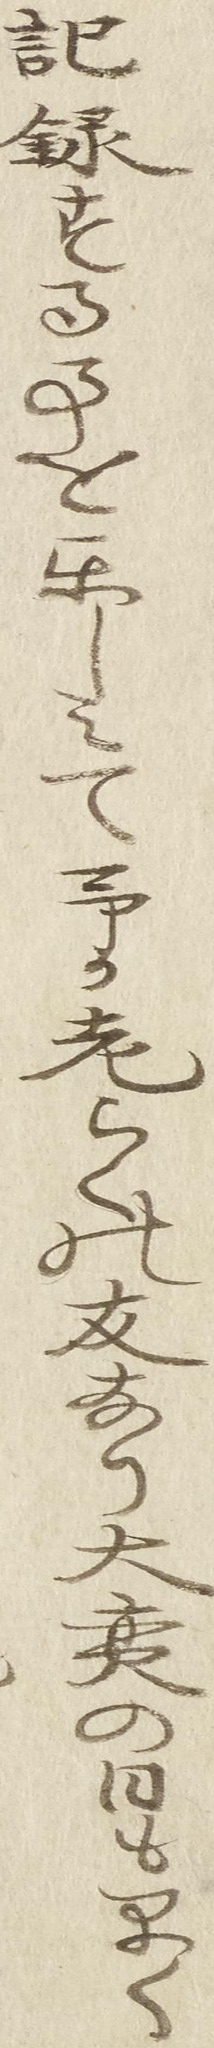記録する事を楽しみて予か老らくの友なり大変の日も早く
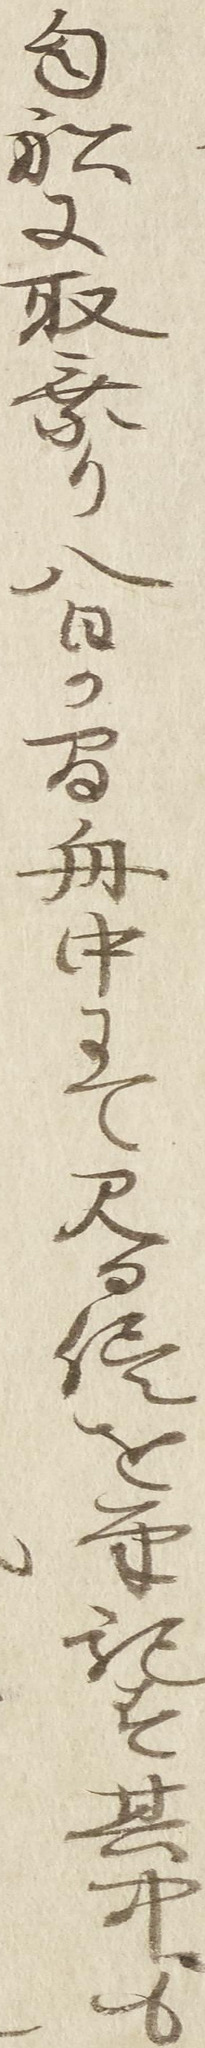自船に取乗り八日の間舟中にて見る侭を筆記す其中にも
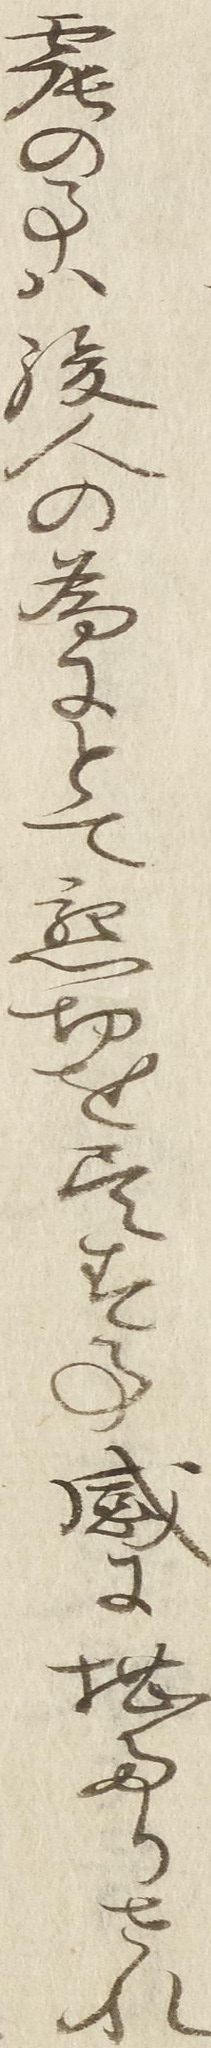震の事は後人の為にとて懇切を尽す事感に堪たりされ
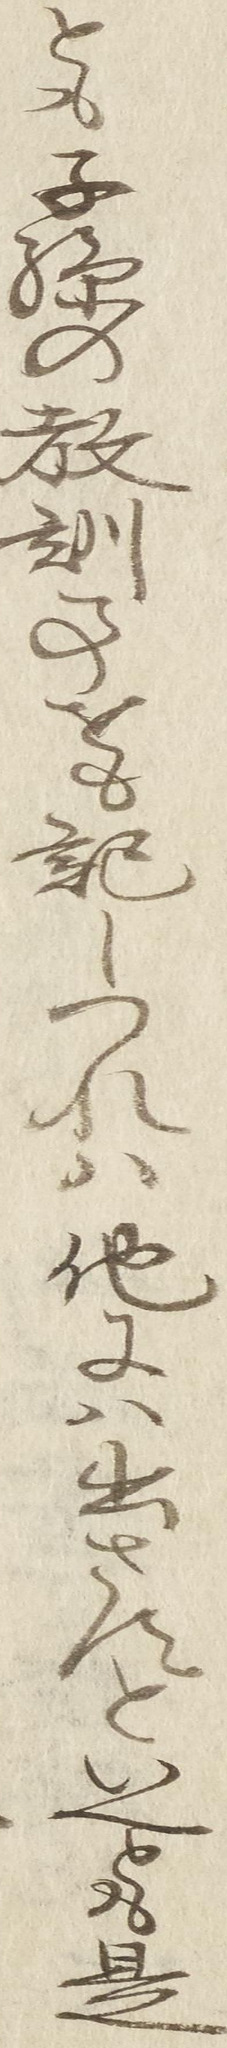とも子孫の教訓事をも記しつれは他には出さすといへとも是
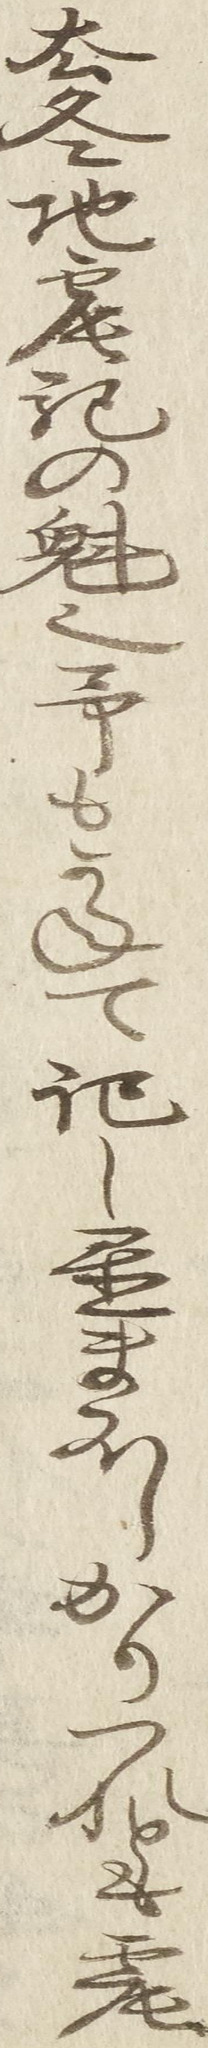去冬地震記の魁也予もかねて記し置まほしかりつれとも震
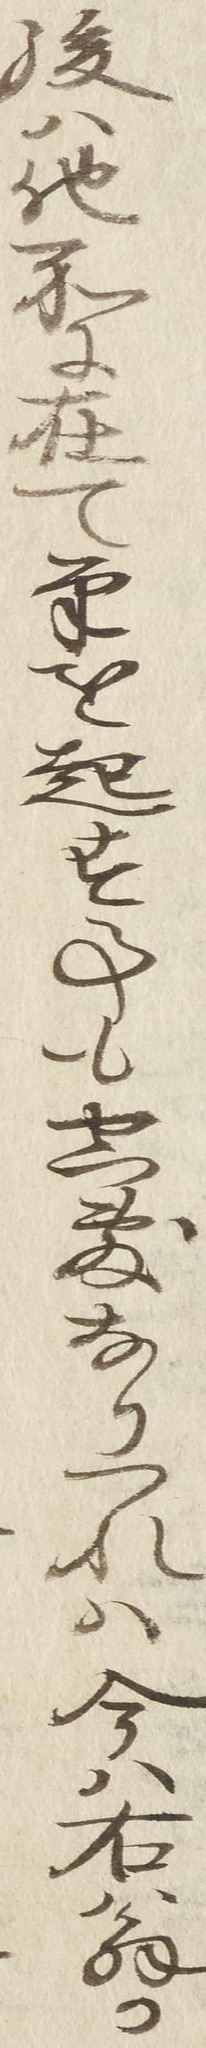後は他所に在て筆を起す事も真敷なりつれは今は右翁か
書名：地震記　上
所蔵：東京大学地震研究所図書室 Earthquake Research Institute Library, The University of Tokyo, JAPAN
